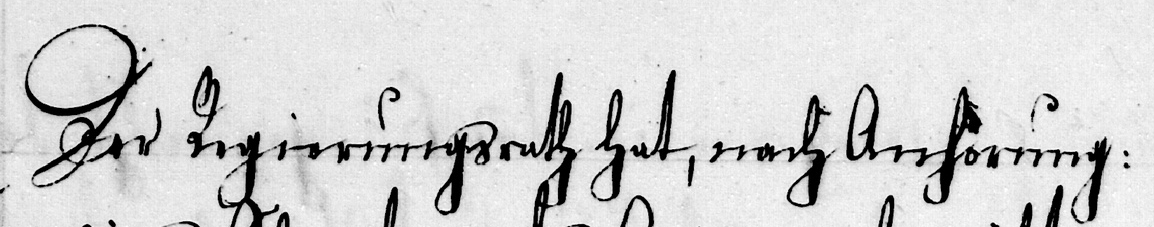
Der Regierungsrath hat, nach Anhörung:
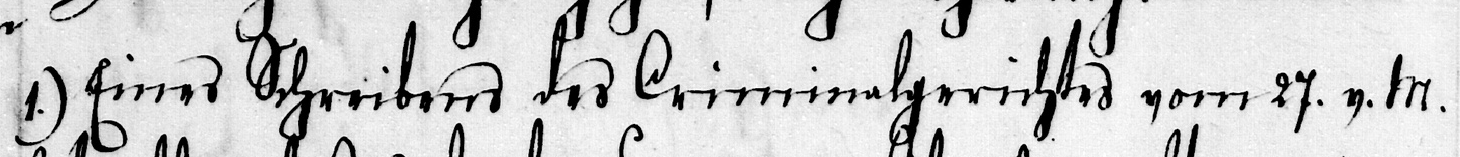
1.) Eines Schreibens des Criminalgerichtes vom 27. v. M.
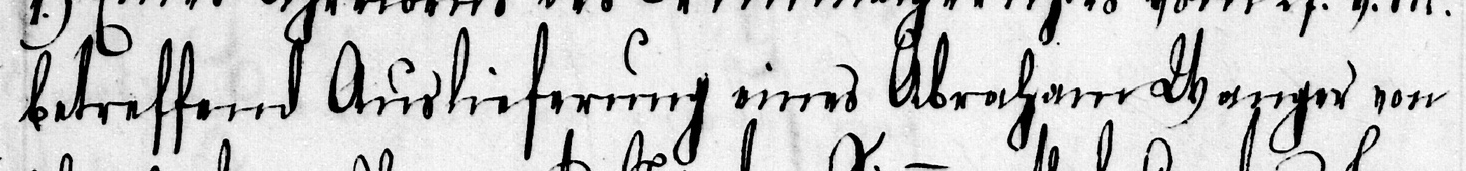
betreffend Auslieferung eines Abraham Wanger von
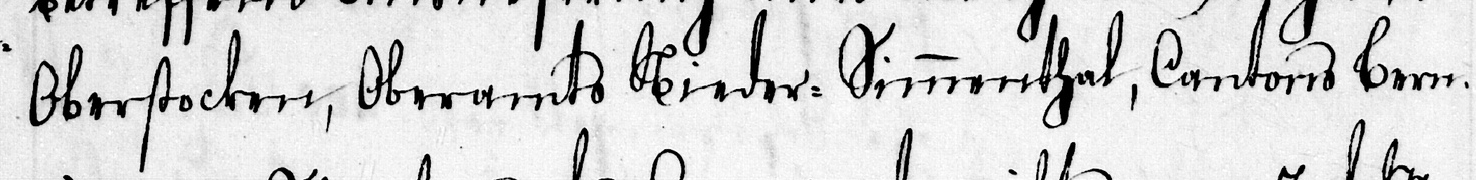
Oberstocken, Oberamts Nieder-Simmenthal, Cantons Bern.
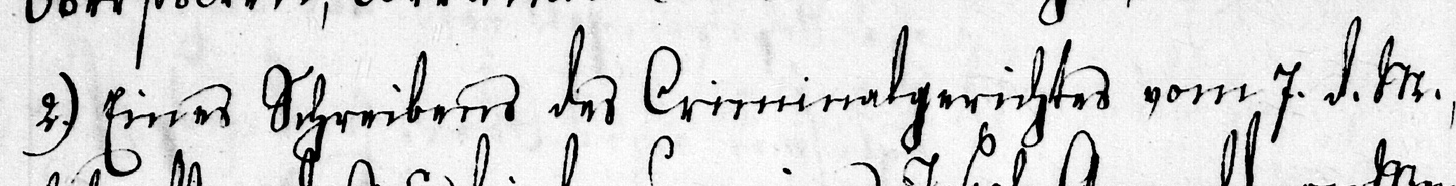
2.) Eines Schreibens des Criminalgerichtes vom 7. d. M.,
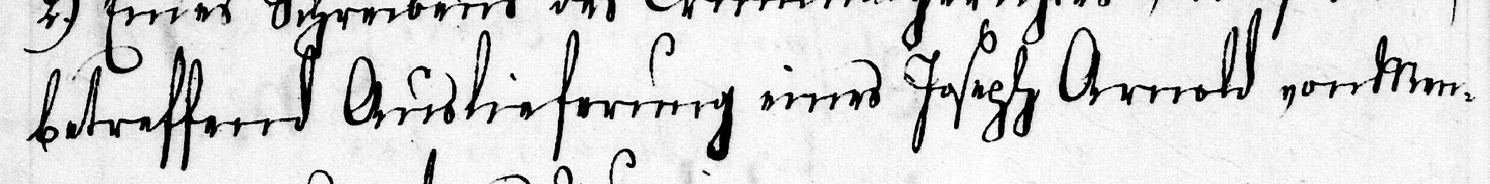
betreffend Auslieferung eines Joseph Arnold von Men¬
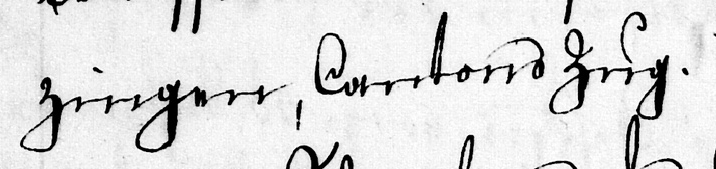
zingen, Cantons Zug.
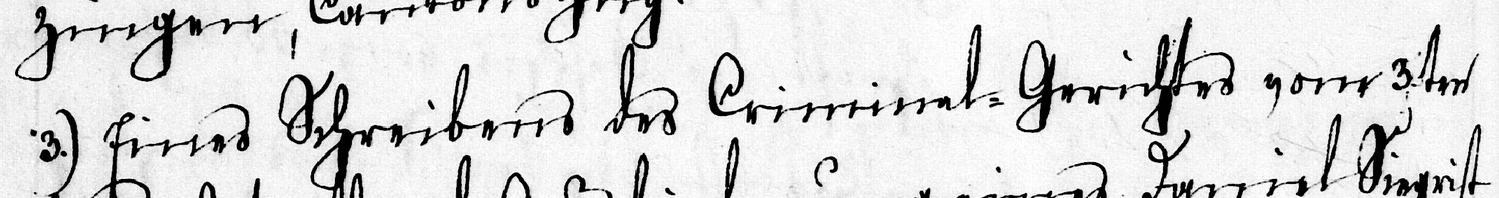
3.) Eines Schreibens des Criminal-Gerichtes vom 3ten
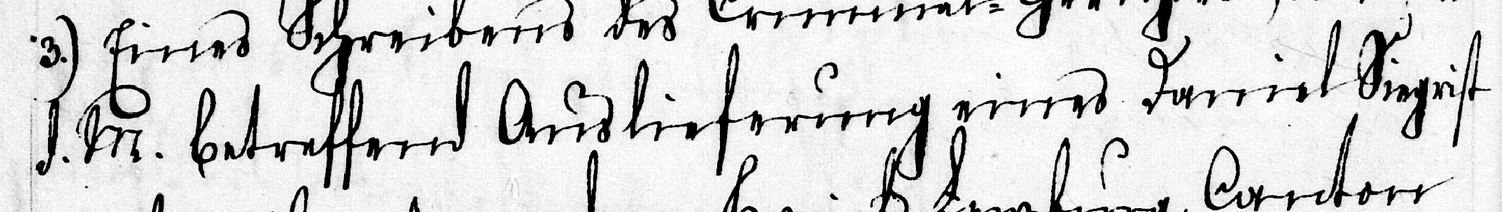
d. M. betreffend Auslieferung eines Daniel Siegrist
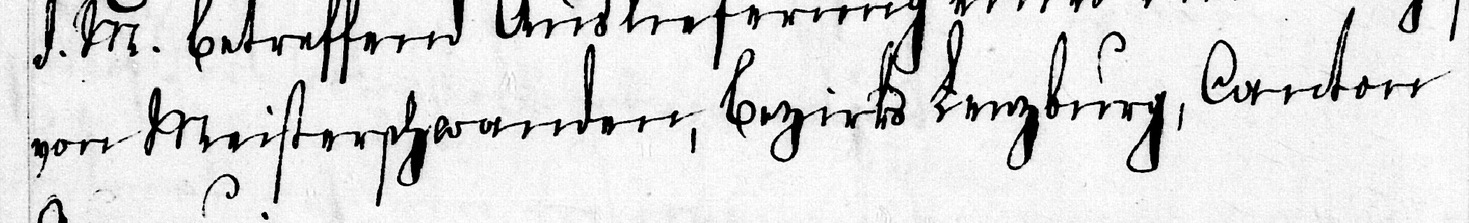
von Meisterschwanden, Bezirks Lenzburg, Canton
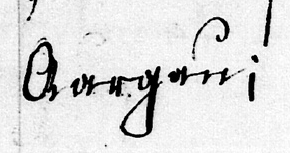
Aargau;
